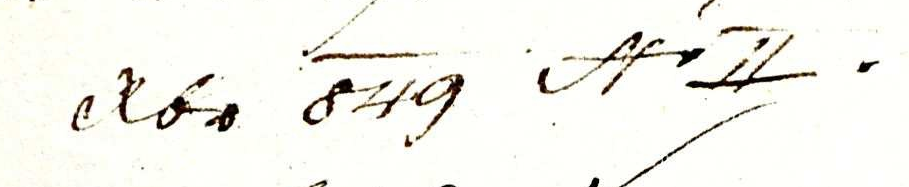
Xbr 849 No II.
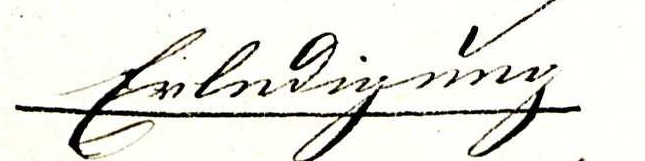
Erledigung
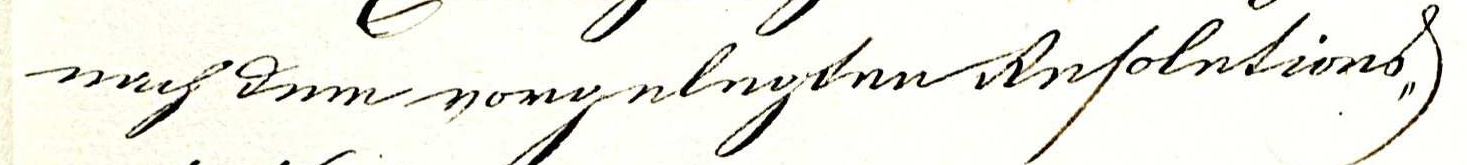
nach dem vorgelegten Resolution¬
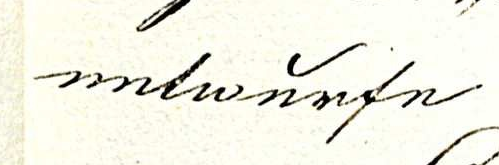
sentwurfe
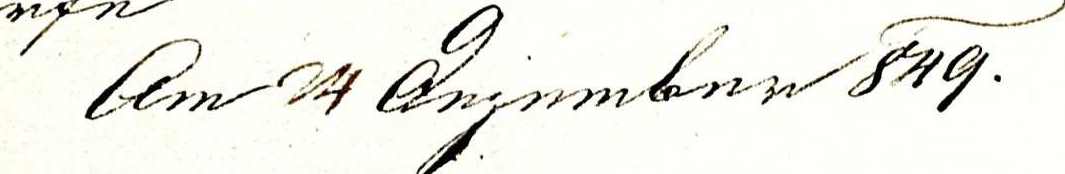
Am 24 Dezember 849.
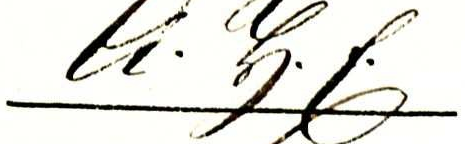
A. H. E.
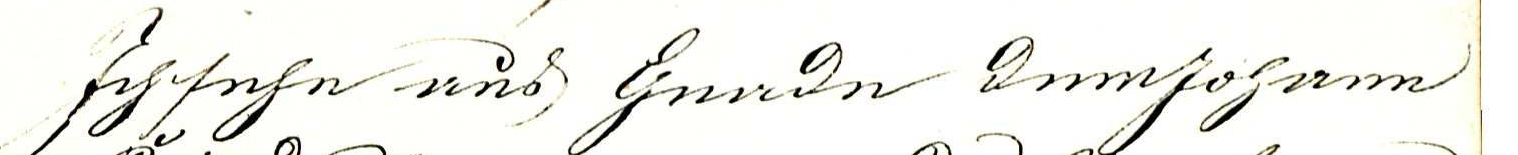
Jch sehe aus, Gnade dem Johnn
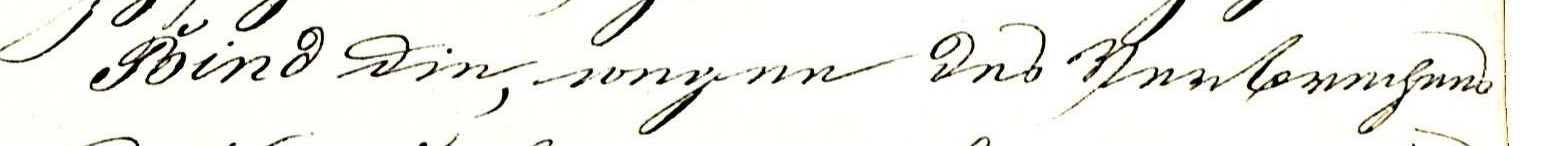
Bind die, wegen des Verbrechens
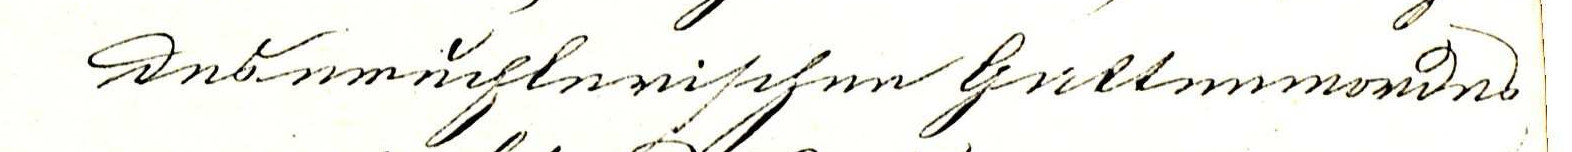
des xxlerischen Gattenmordes
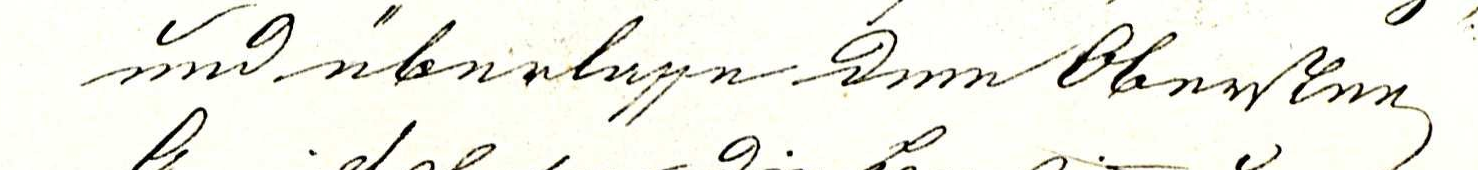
und überlasse dem Obersten
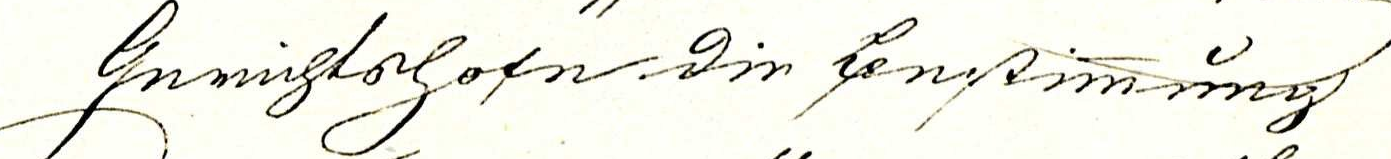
Gerichtshofe die Bestimmung
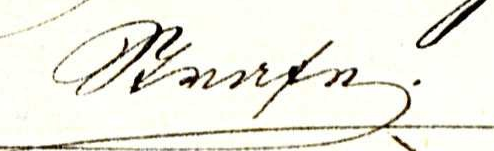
Strafe.
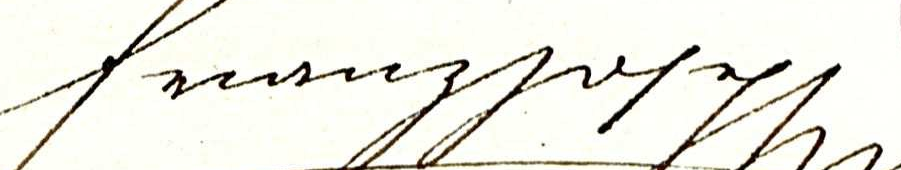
Franz Joseph
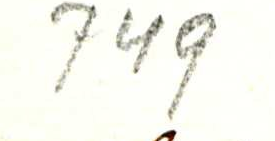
749
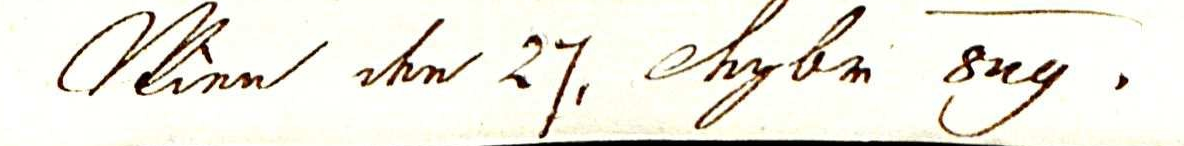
Wien den 27. Dezbr 849.
